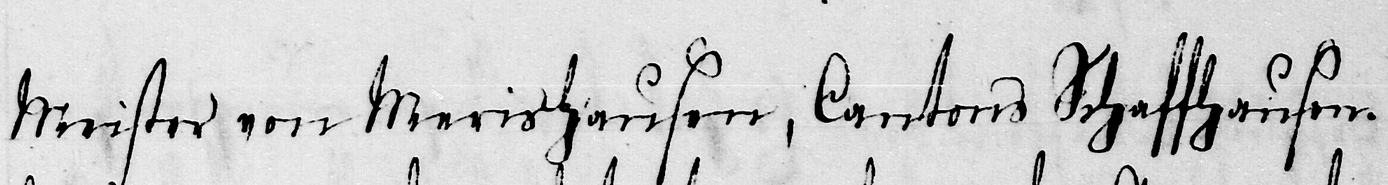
Meister von Merishausen, Cantons Schaffhausen.
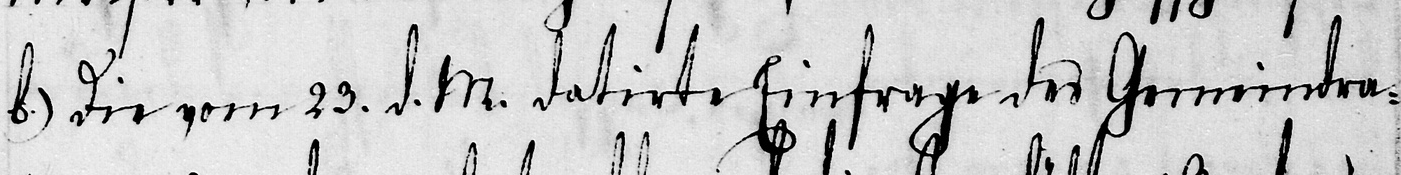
b.) Die vom 23. d. M. datirte Einfrage des Gemeindra¬
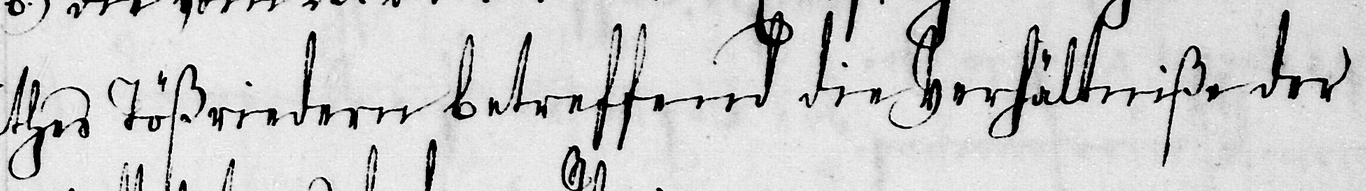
thes Tößriedern betreffend die Verhältniße der
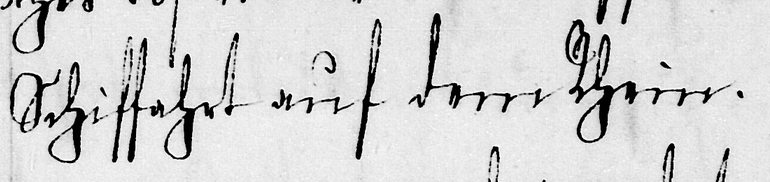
Schiffahrt auf dem Rhein.
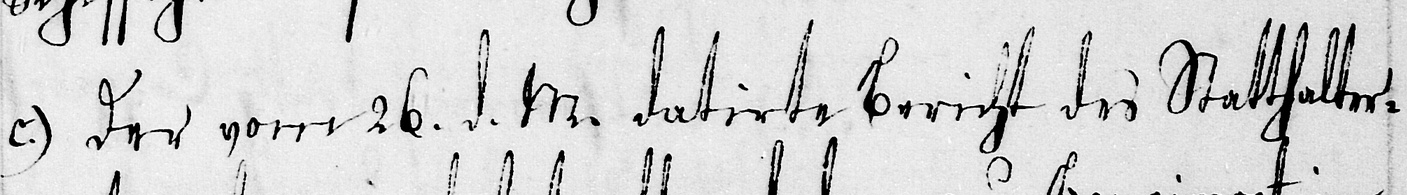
c.) Der vom 26. d. M. datirte Bericht des Statthalte¬
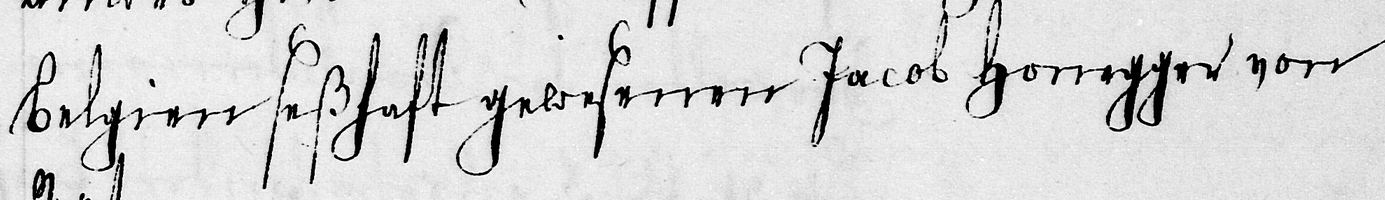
Belgien seßhaft gewesenen Jacob Honegger von
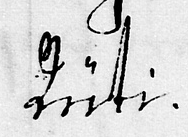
Rüti.
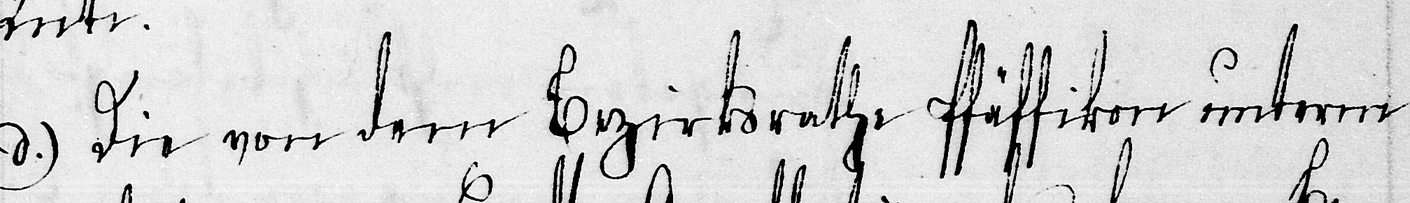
d.) Die von dem Bezirksrathe Pfäffikon unterm
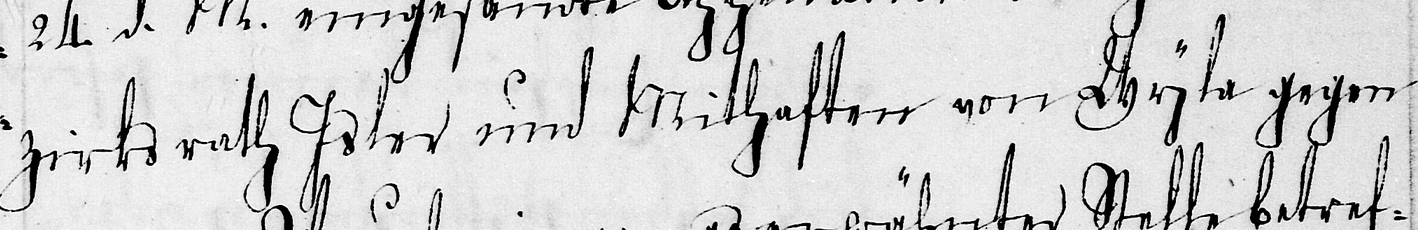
zirksrath Isler und Mithaften von Wyla gegen
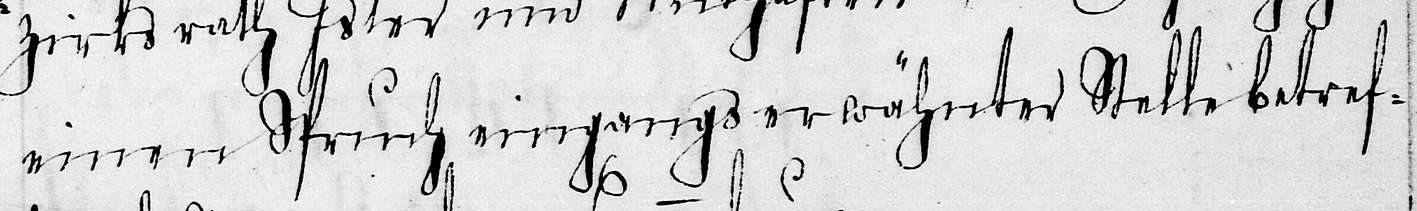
einen Spruch eingangserwähnter Stelle betref¬
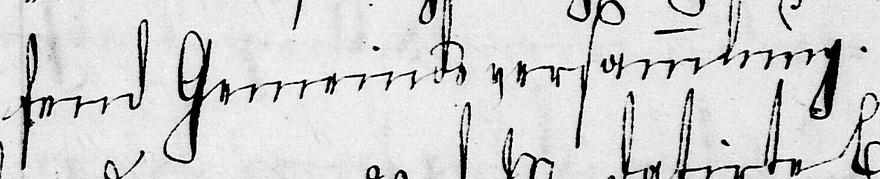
fend Gemeindsversammlung.
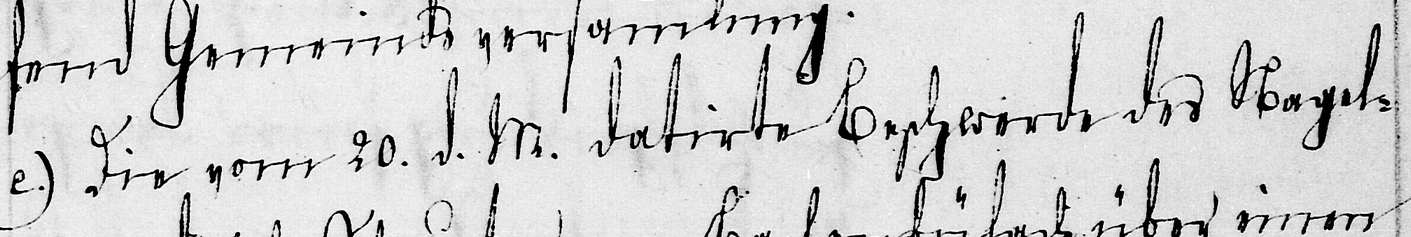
3.) Die vom 20. d. M. datirte Beschwerde des Nagel¬
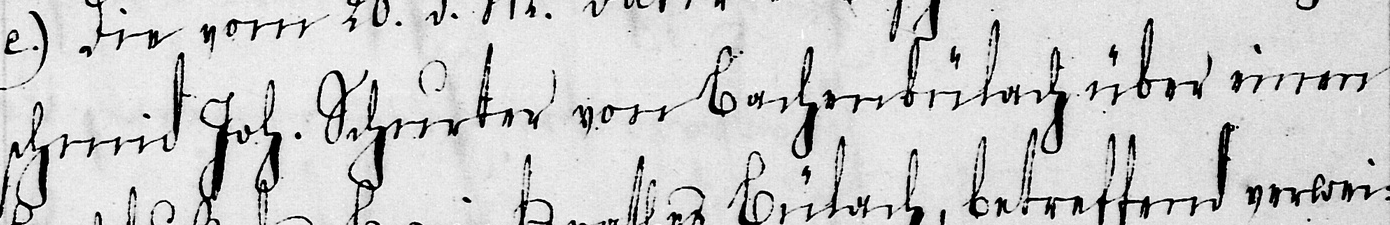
schmid Joh. Schurter von Bachenbülach über einen
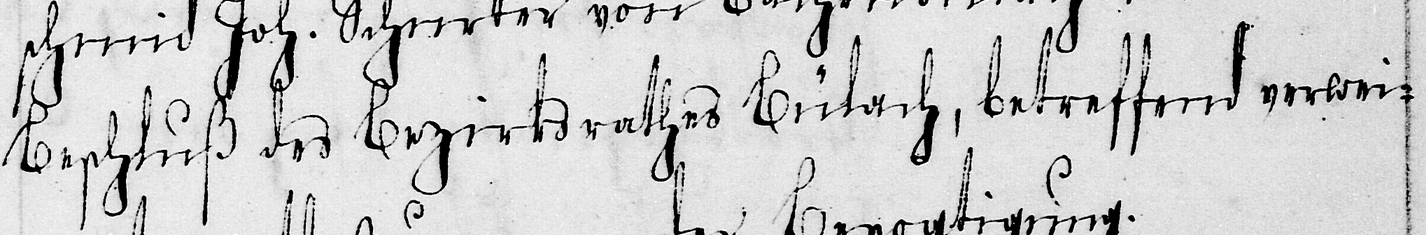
Beschluß des Bezirksrathes Bülach, betreffend verwei¬
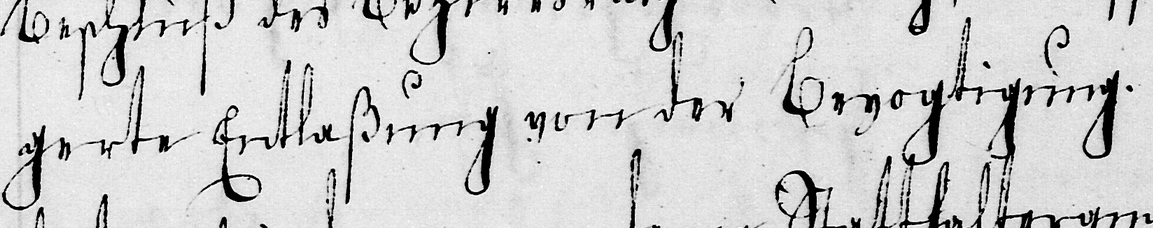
gerte Entlaßung von der Bevogtigung.
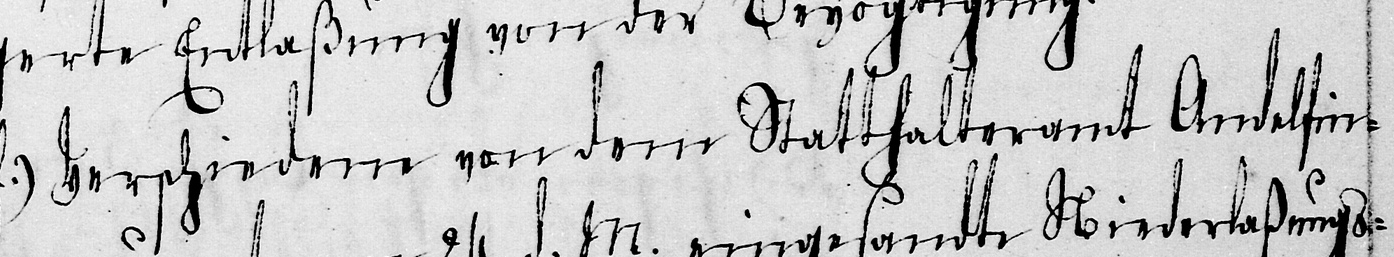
Verschiedene von dem Statthalteramt Andelfin¬
